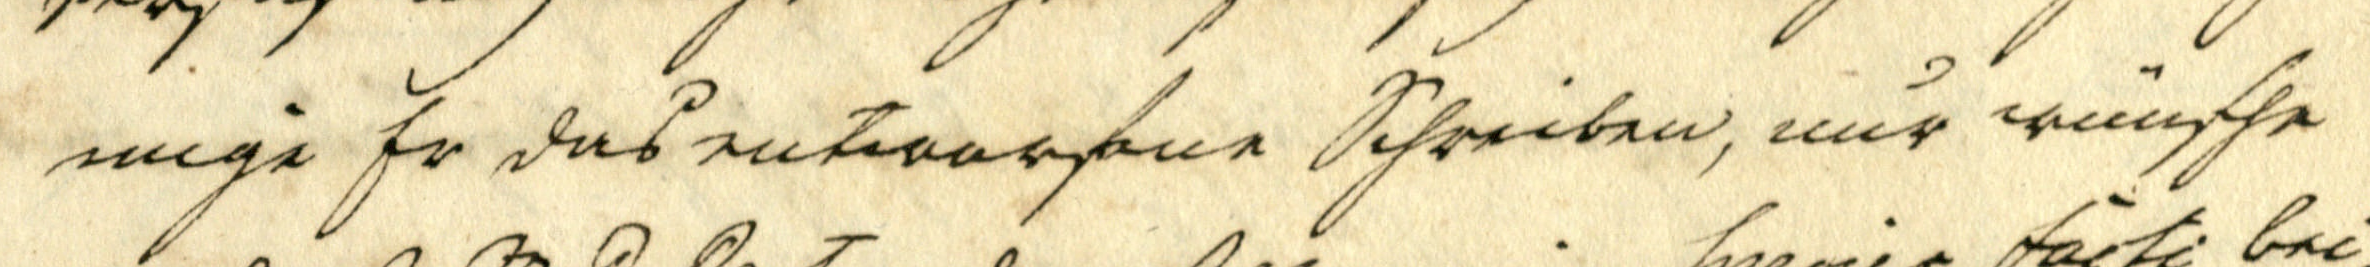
mige Er das entworfene Schreiben, nur wünsche
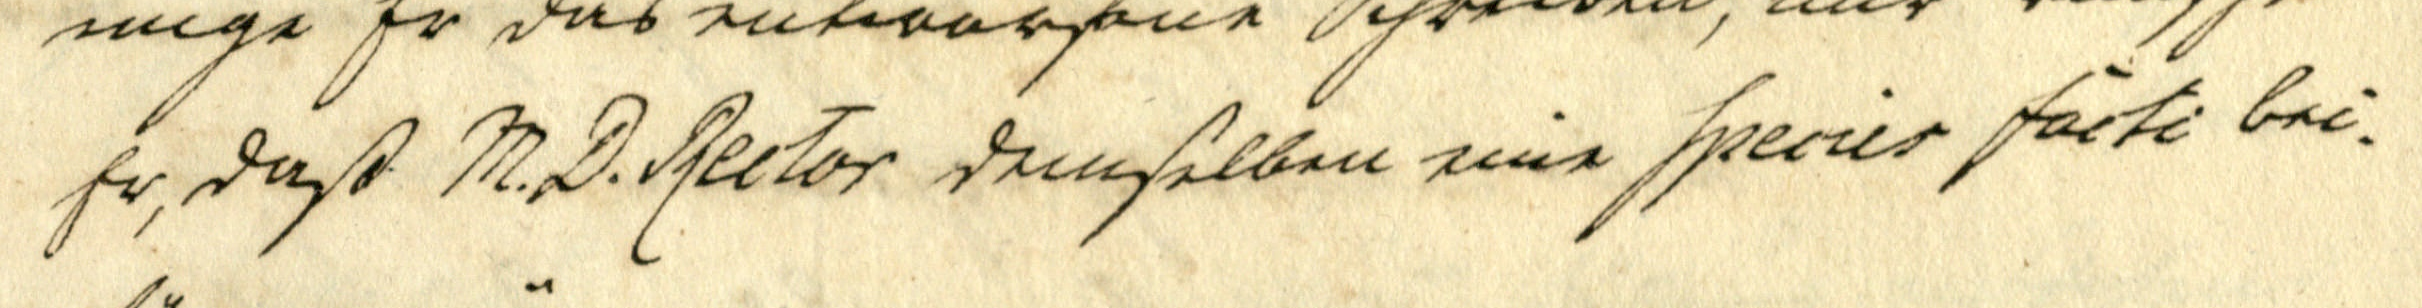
Er, daß M. D. Rector demselben eine species Facti bei¬
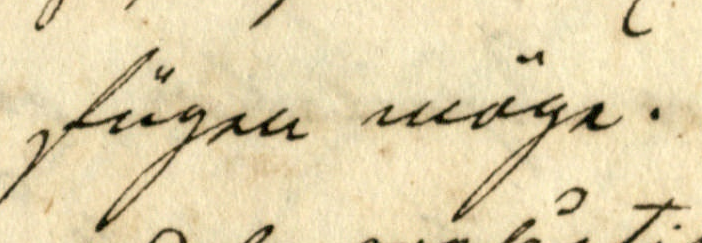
fügen möge.
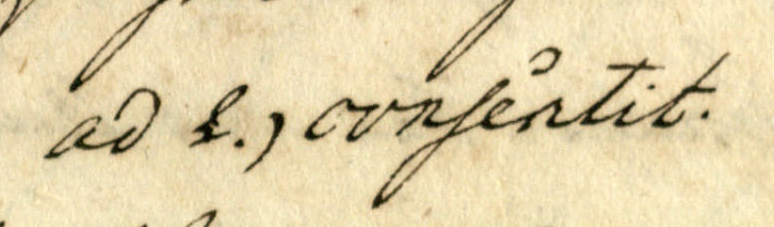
ad 2., consentit.
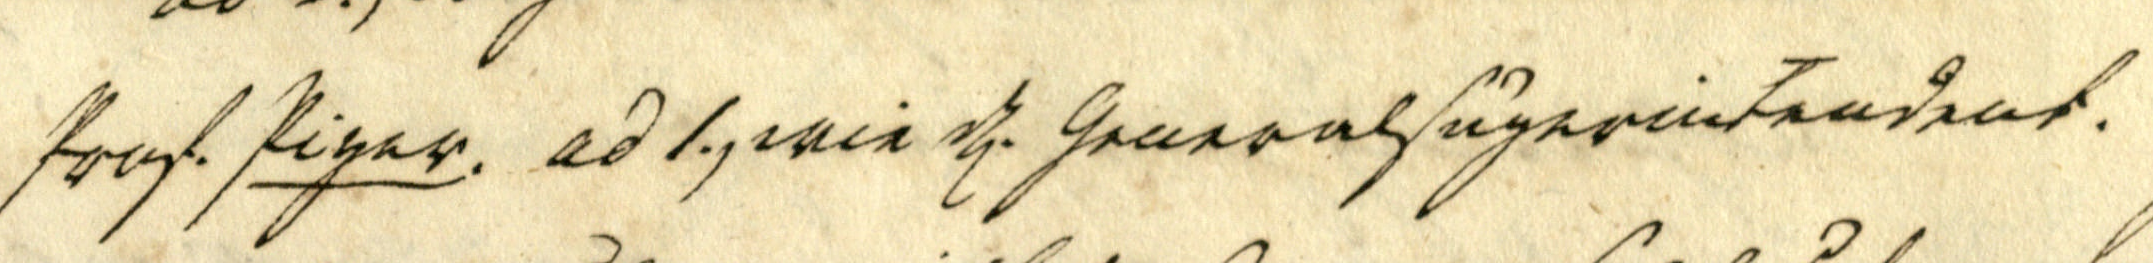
Prof. Piper, ad 1. wie dh. Generalsuperintendent.
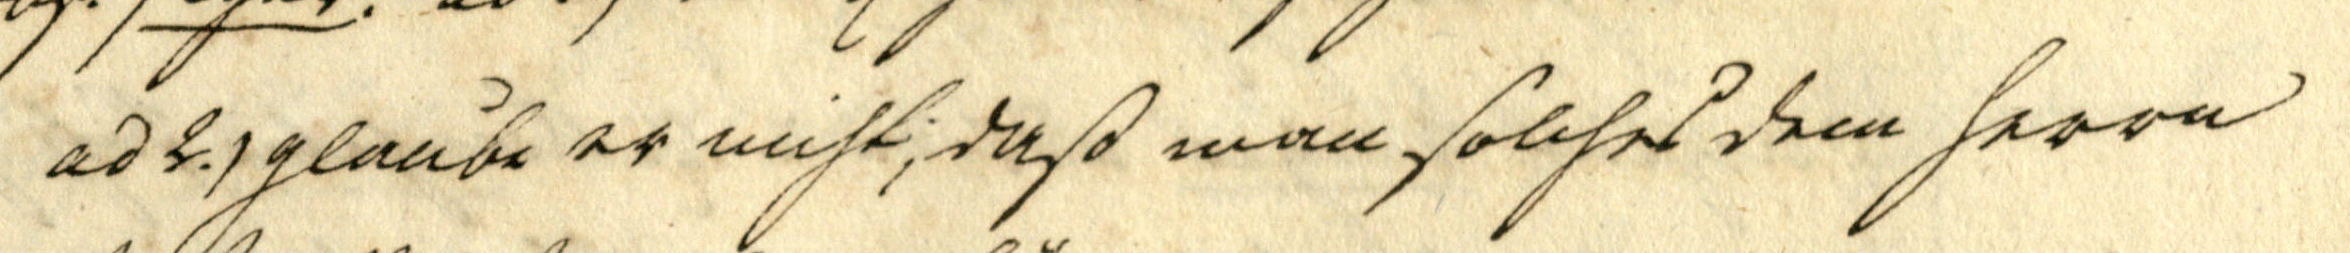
ad 2., glaube er nicht, daß man solches dem Herrn
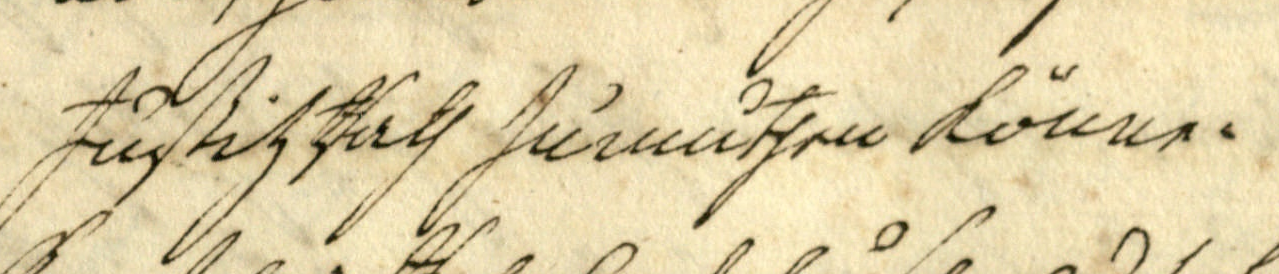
JustizRath zumuthen könne.
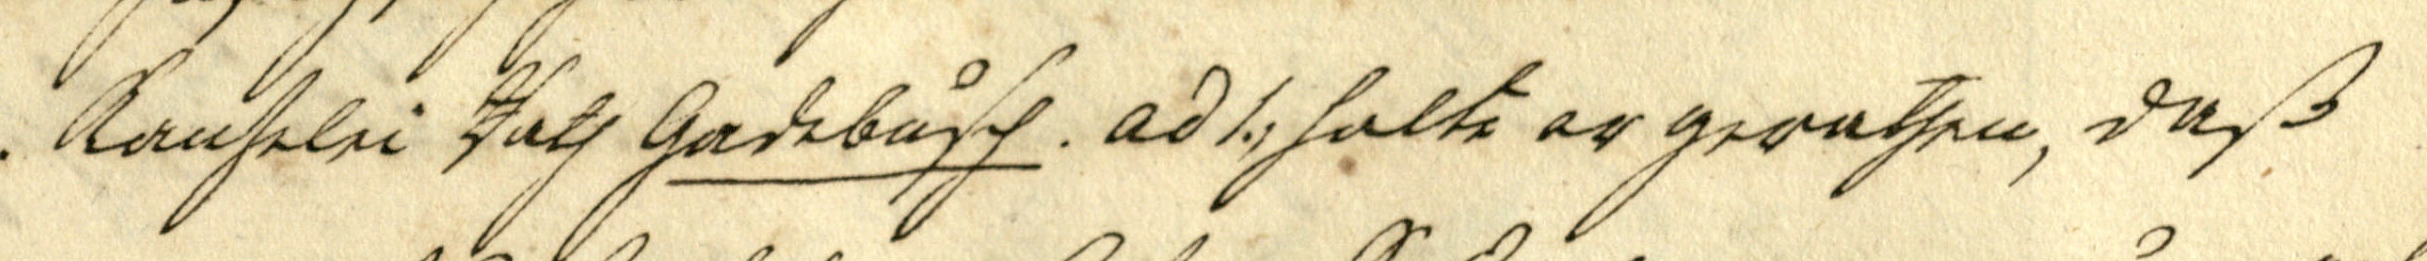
Kanzelei Rath Gadebusch. ad 1. halte er gerathen, daß
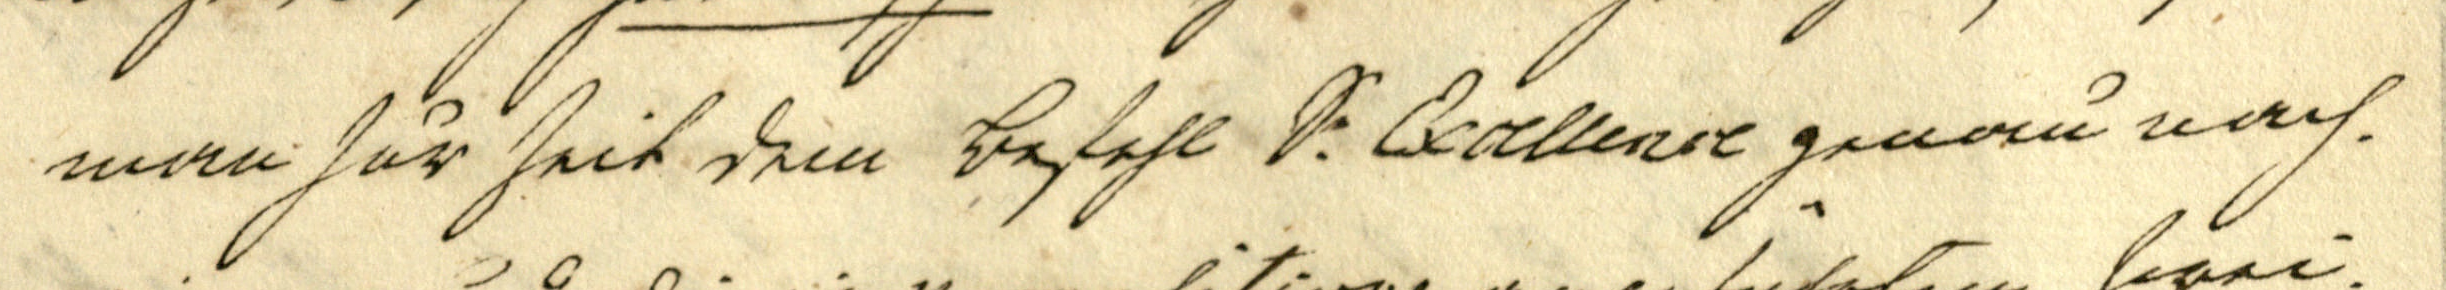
man zur Zeit dem Befehl Sr Excellence genau nach¬
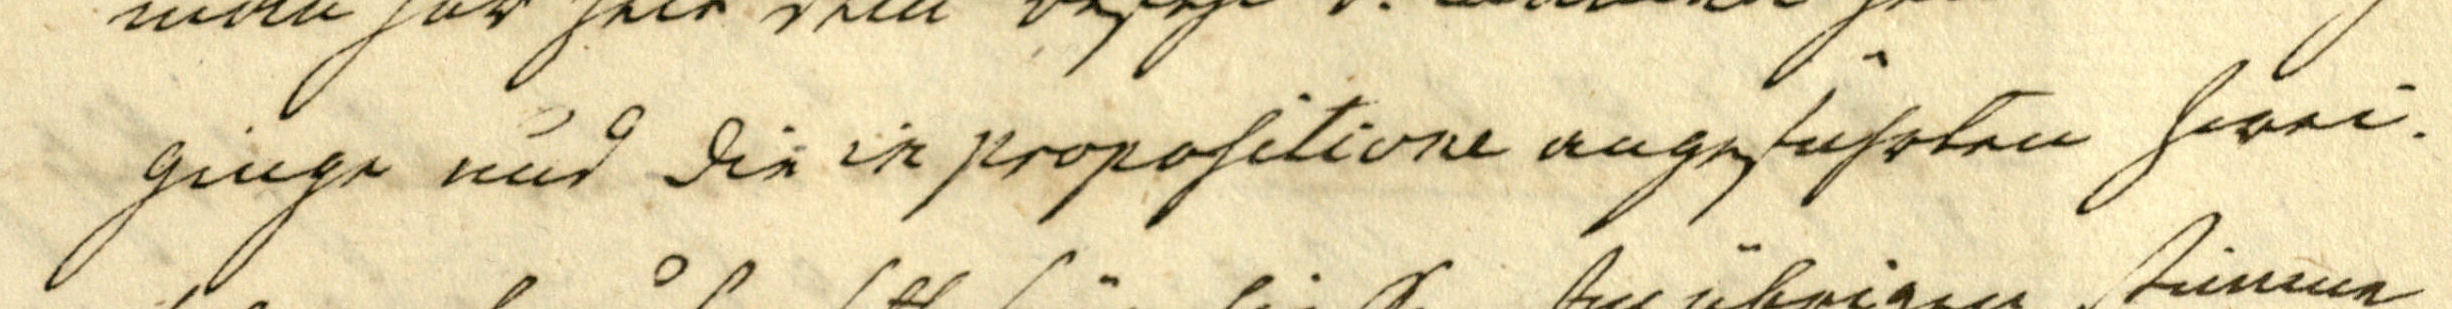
ginge und die in propositione angeführten Zwei¬
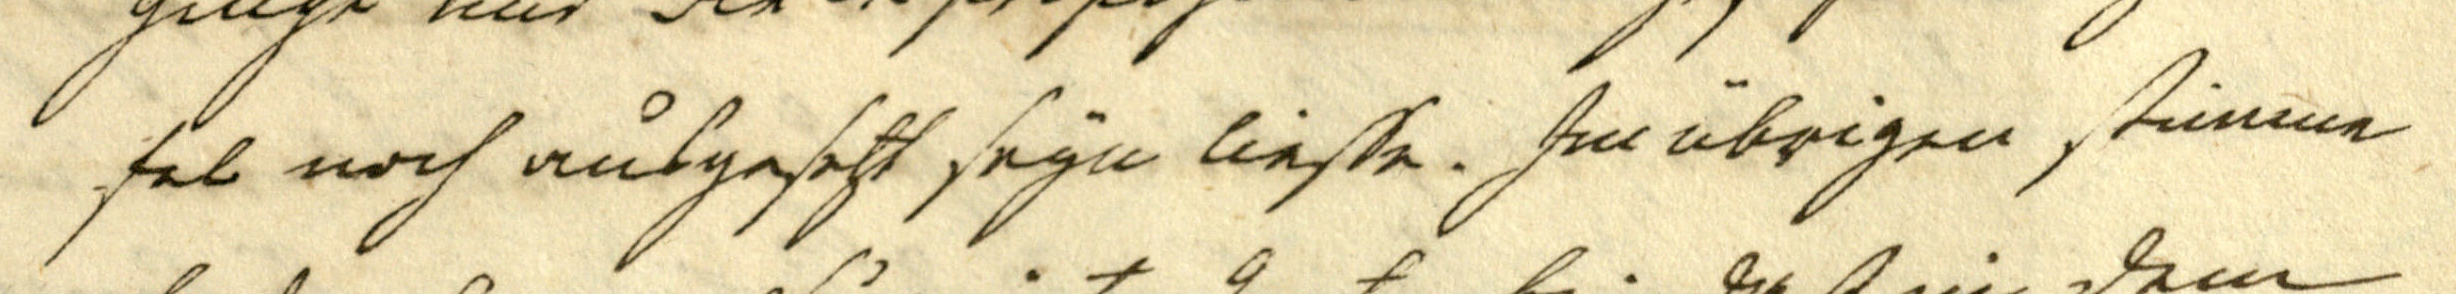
fel noch ausgesetzt seÿn liesse. Im übrigen stimme
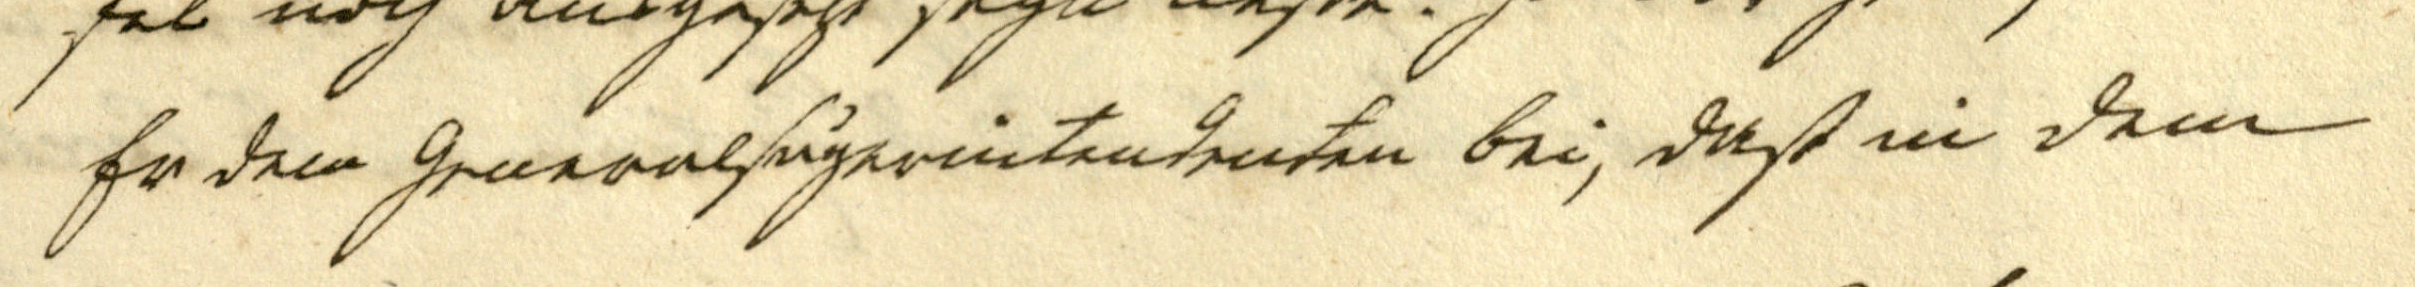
Er dem Generalsuperintendenten bei, daß in dem
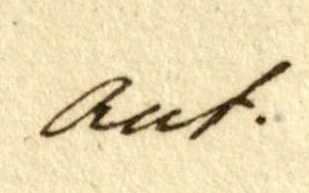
Ant.
